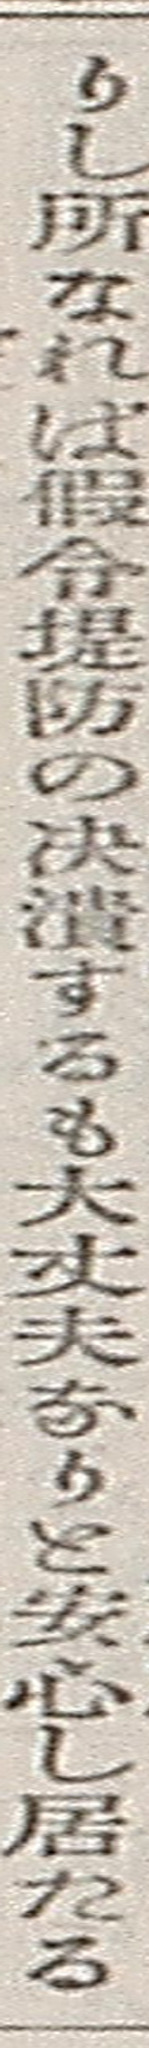りし所ならば仮令堤防の决潰するも大丈夫なりと安心し居たる
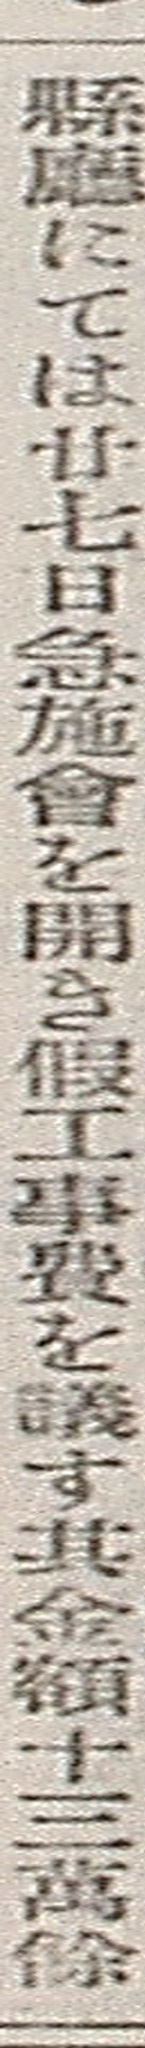県庁にては廿七日急施会を開き仮工事費を議す其金額十三万円餘
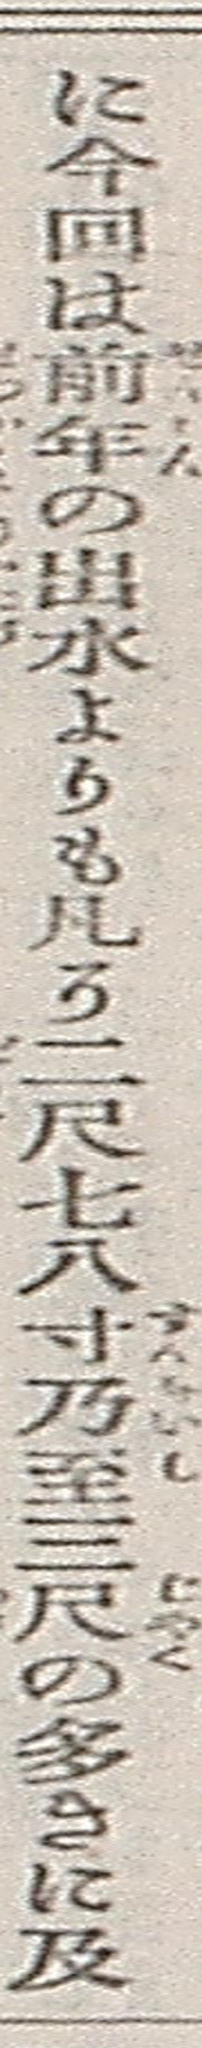に今回は前年の出水よりも凡そ二尺七八寸乃至三尺の多きに及
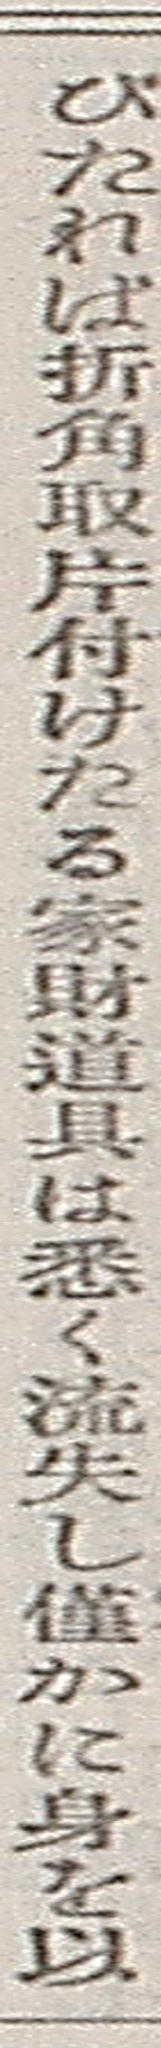びたれば折角取片付けたる家財道具は悉く流失し僅かに身を以
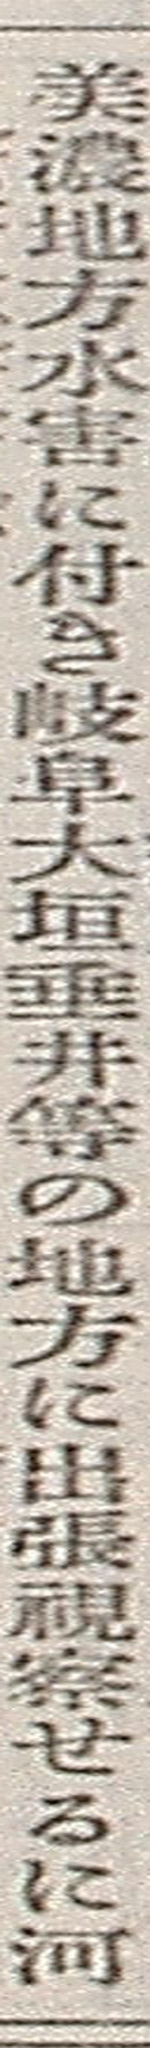美濃地方水害に付き岐阜大垣垂井等の地方に出張視察せるに河
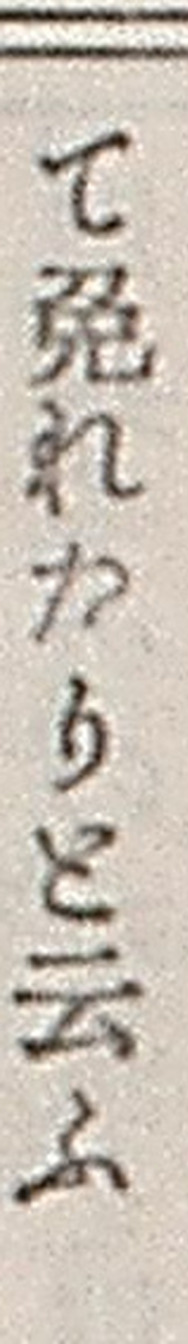て免れたりと云ふ
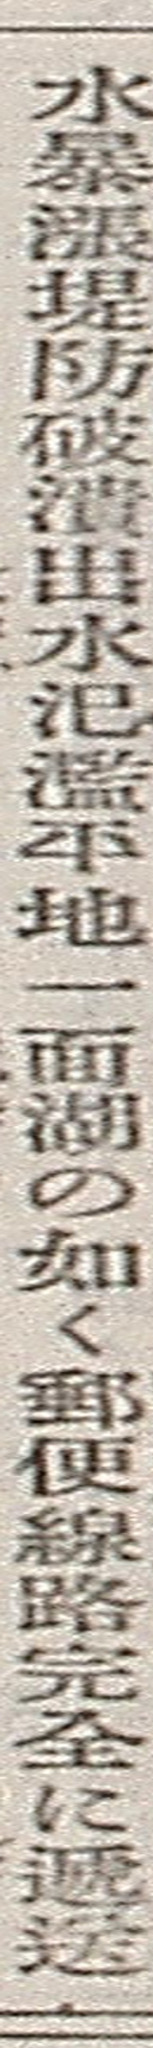水暴漲堤防破潰出水氾濫平地一面湖の如く郵便線路完全に逓送
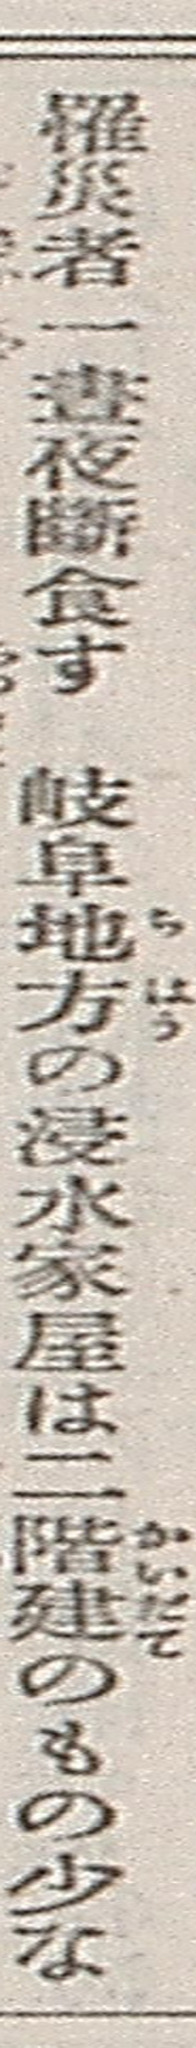罹災者一晝夜断食す岐阜地方の浸水家屋は二階建のもの少な
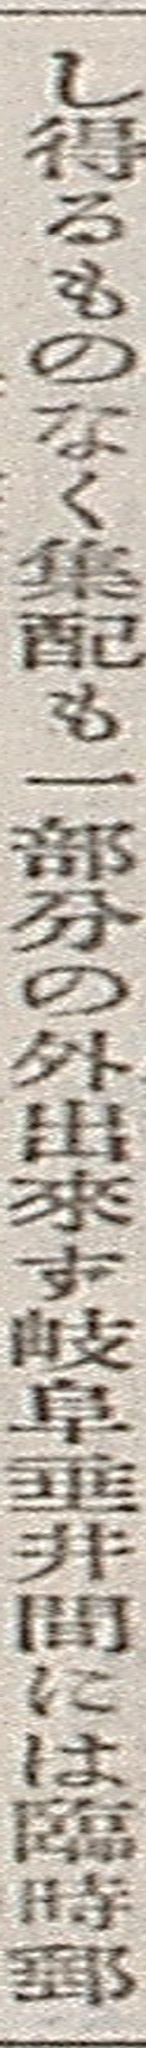し得るものなく集配も一部分の外出来ず岐阜垂井間には臨時郵
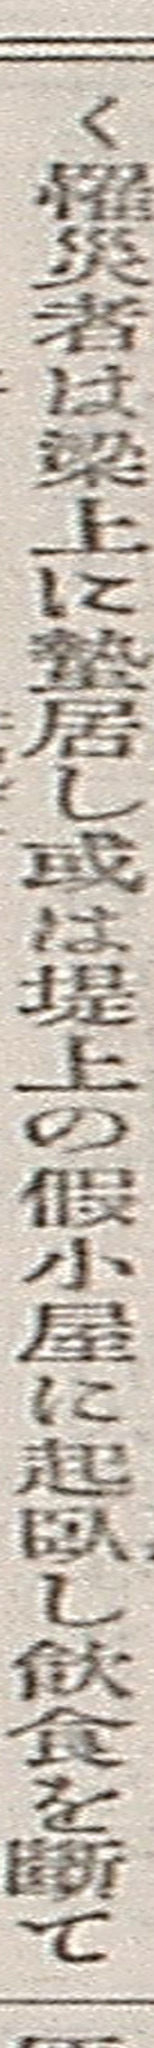く罹災者は梁上に蟄居し或は堤上の仮小屋に起臥し飲食を断て
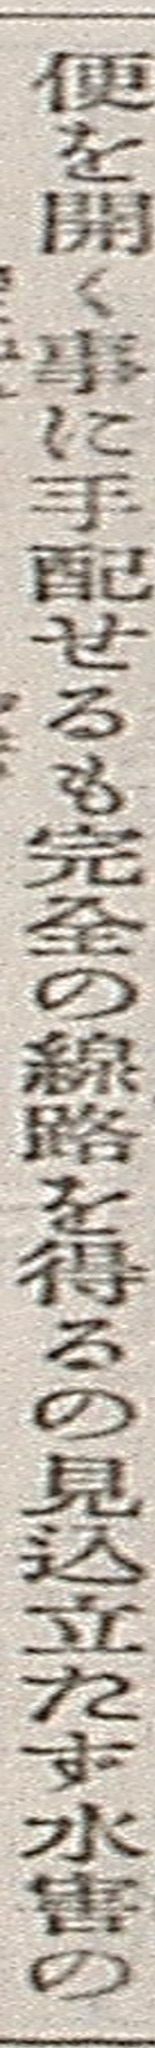便を開く事に手配せるも完全の線路を得るの見込立たず水害の
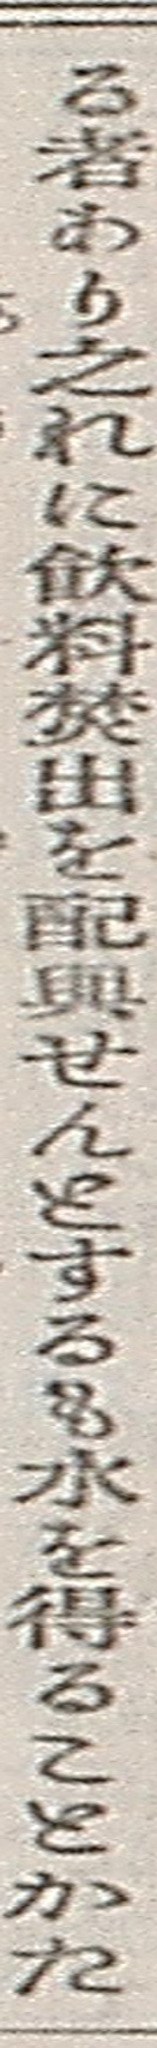る者あり之れに飲料焚出を配輿せんとするも水を得ることかた
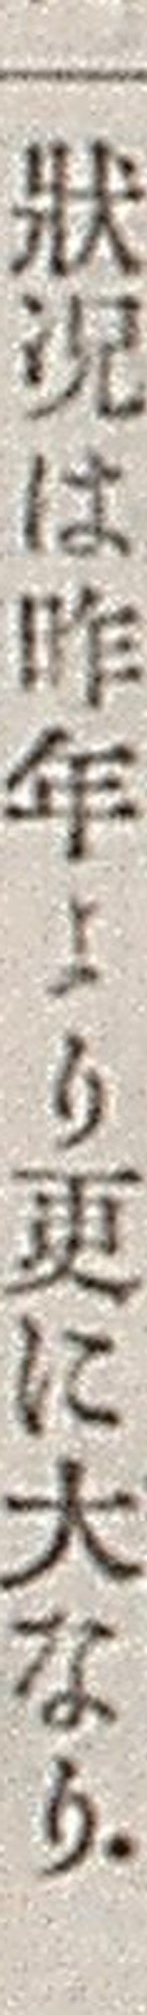状況は昨年より更に大なり
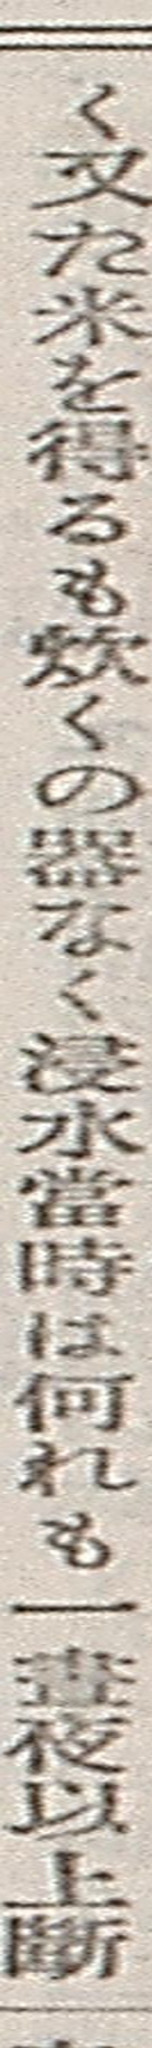く又た米を得るも炊くの器なく浸水当時は何れも何れも一晝夜以上断
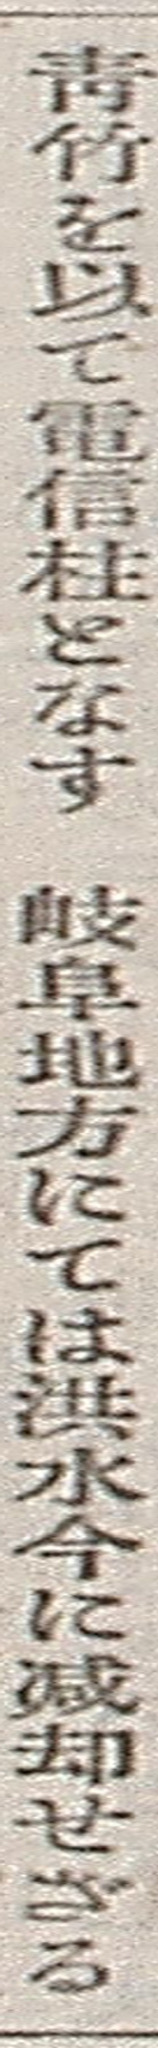青竹を以て電信柱となす岐阜地方にては洪水今に滅却せざる
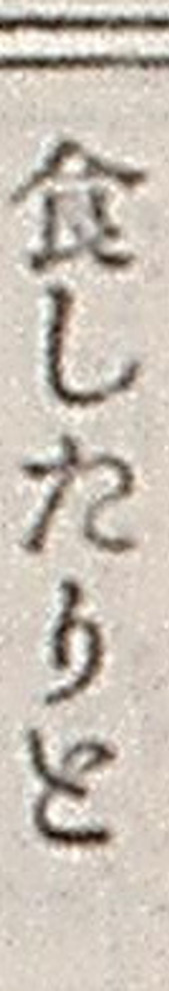食したりと
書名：風俗畫報臨時増刊第百二十六號　洪水被害録（中）
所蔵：東京大学地震研究所図書室 Earthquake Research Institute Library, The University of Tokyo, JAPAN
